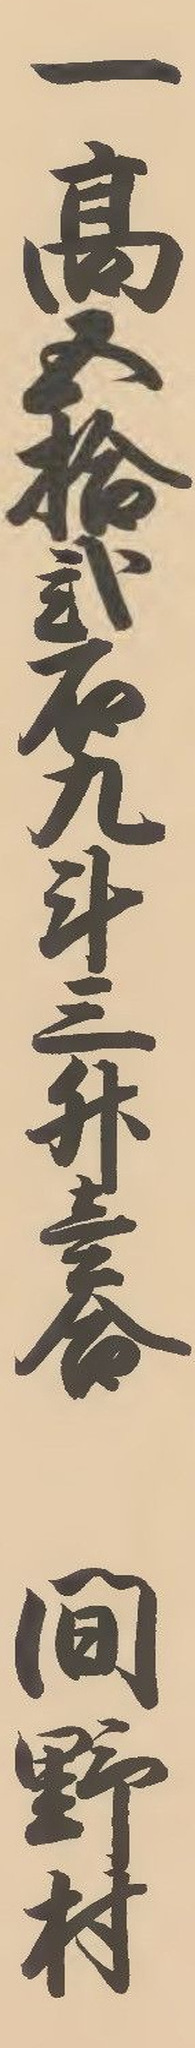一髙五拾弐石九斗三升壱合間野村
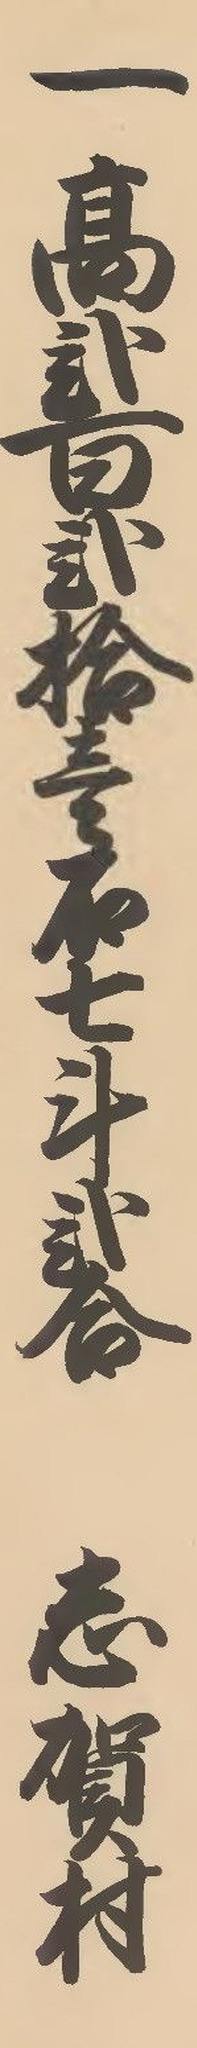一髙弐百弐拾壱石七斗弐合志賀村

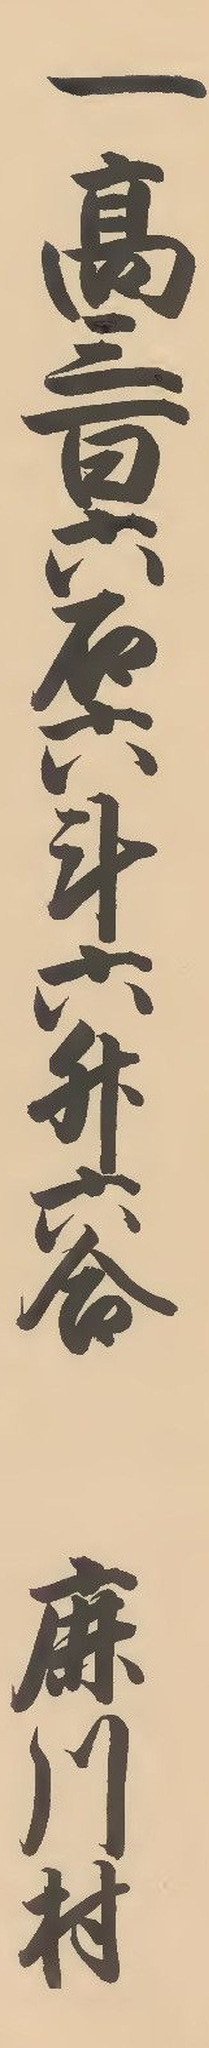一髙三百六石六斗六升六合鹿川村
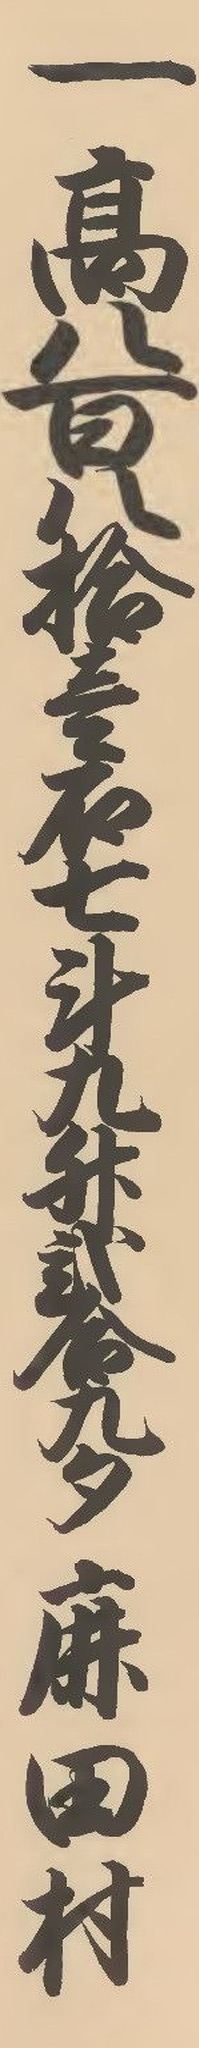一髙八百八拾壱石七斗九升弐合九夕鹿田村
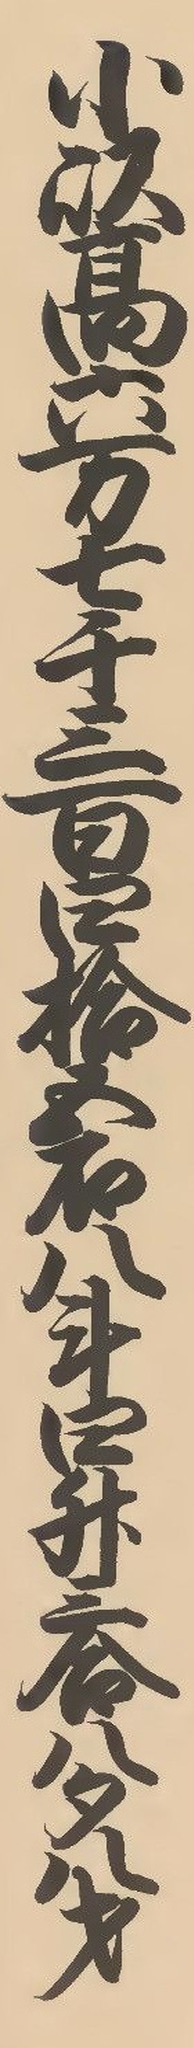小以髙六万七千三百四拾五石八斗四升三合八夕八才

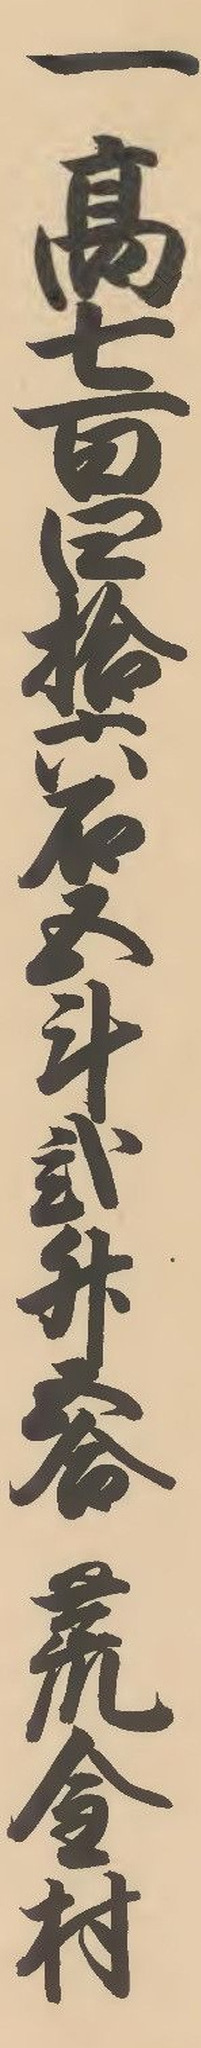一髙七百四拾六石五斗弐升五合荒金村
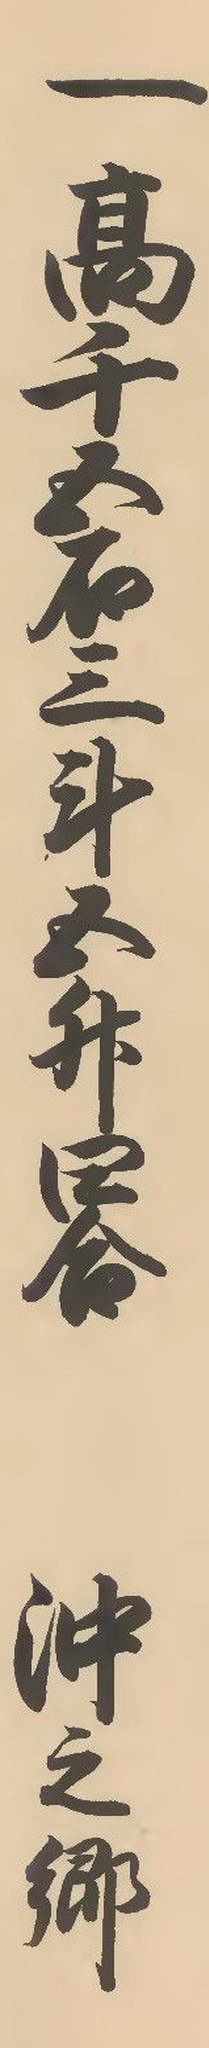一髙千五石三斗五升四合沖之郷
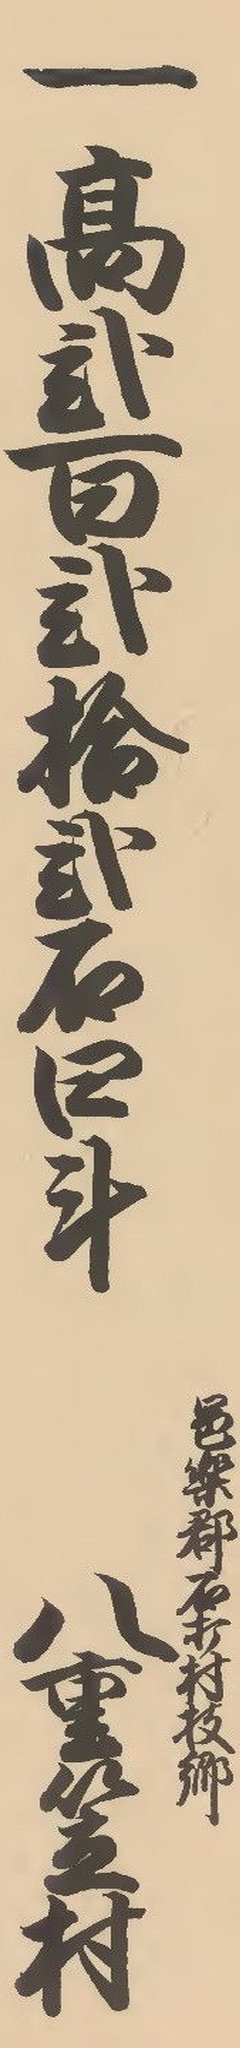一髙弐百弐拾弐石四斗八重笠村
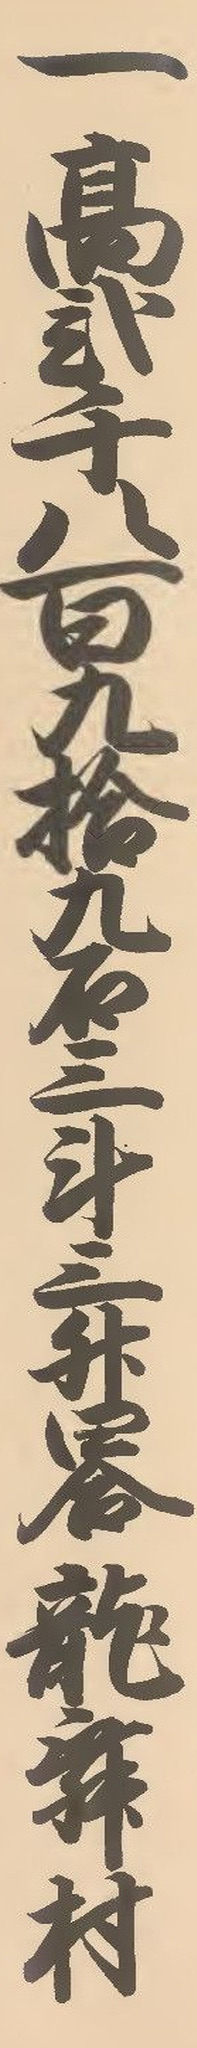一髙弐千八百九拾九石三斗三升四合龍舞村
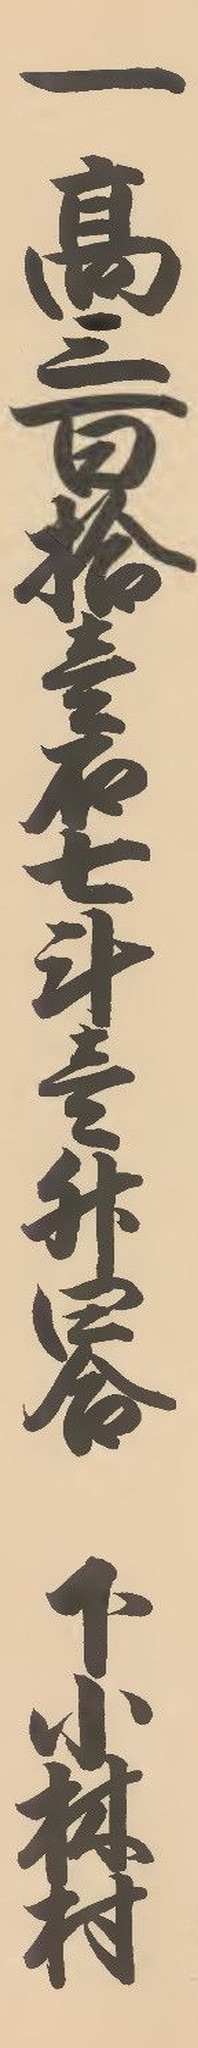一髙三百拾壱石七斗壱升四合下小林村
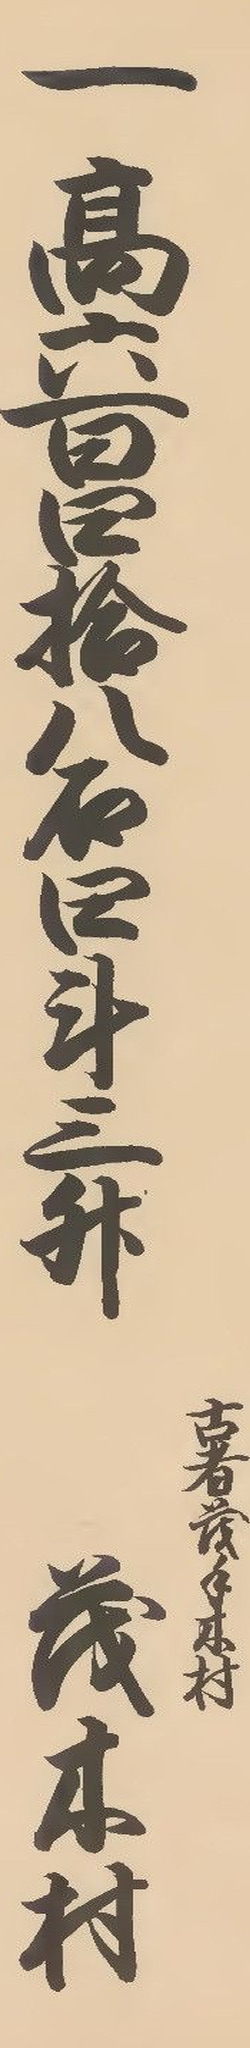一髙六百四拾八石四斗三升茂木村
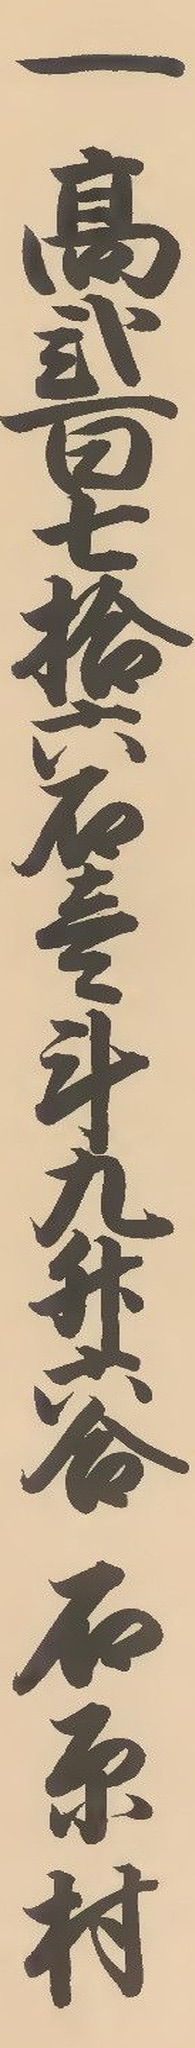一髙弐百七拾六石壱斗九升六合石原村

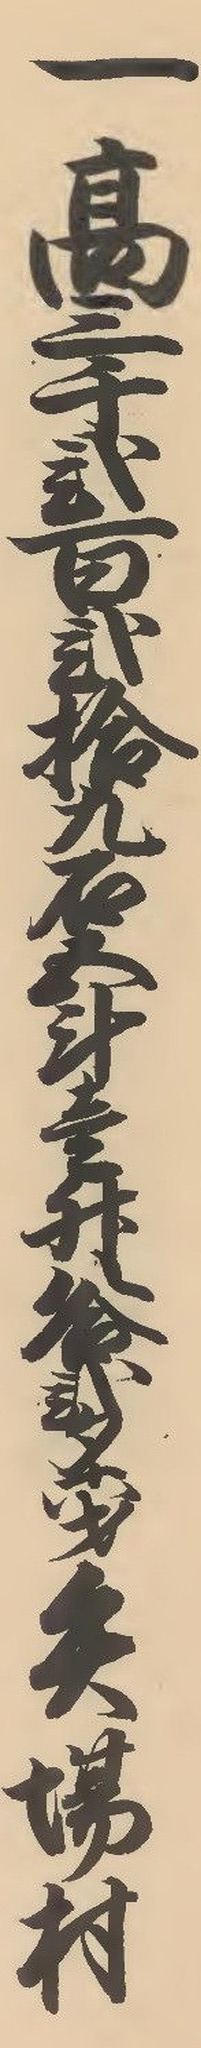一髙三千弐百弐拾九石五斗壱升八合弐夕六才
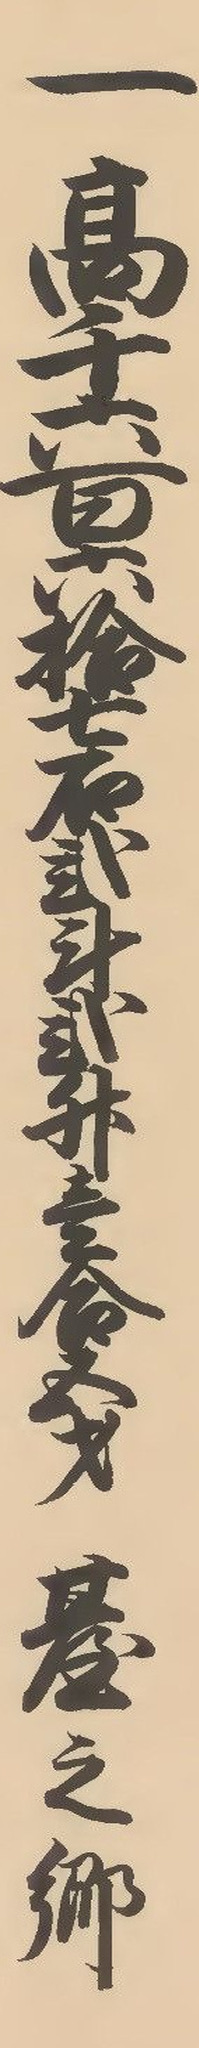一髙千六百六拾七石弐斗弐升壱合五夕臺之郷
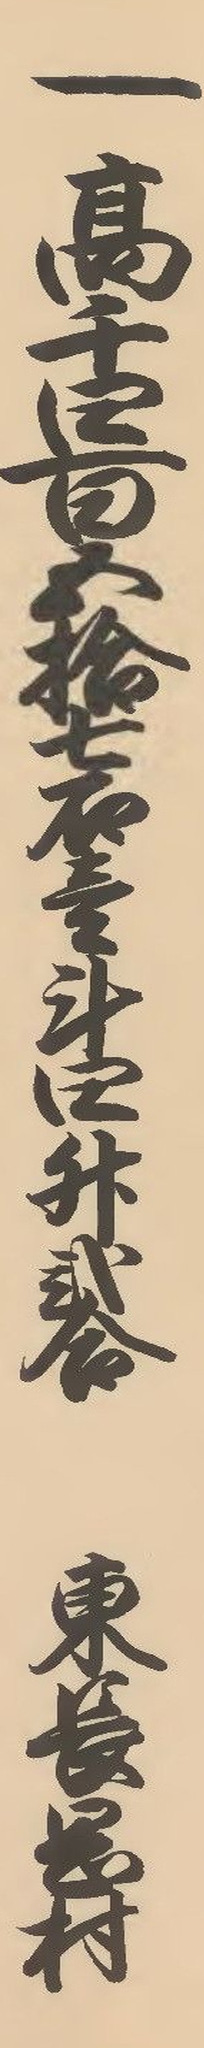一髙千四百五拾七石壱斗四升弐合東長岡村
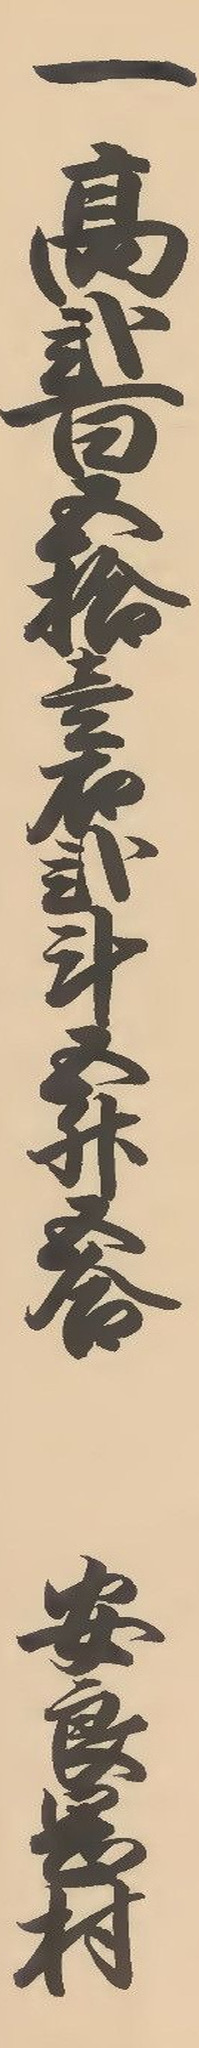一髙弐百五拾壱石弐斗五升五合安良岡村
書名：上野国郷帳
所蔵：国立公文書館 National Archives of Japan
